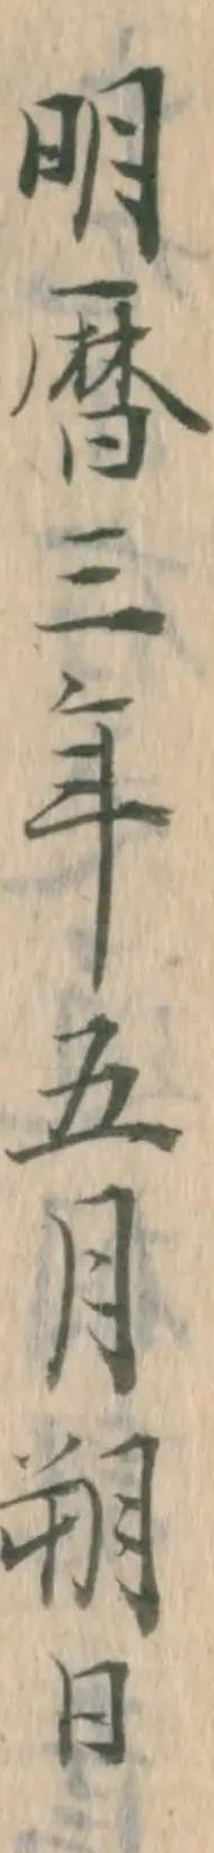明暦三年五月朔日
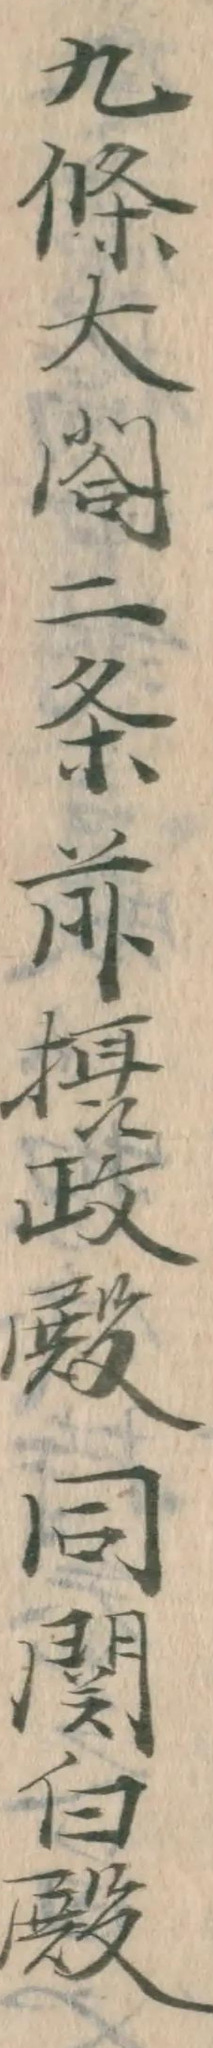九条大閤二条前摂政殿同関白殿
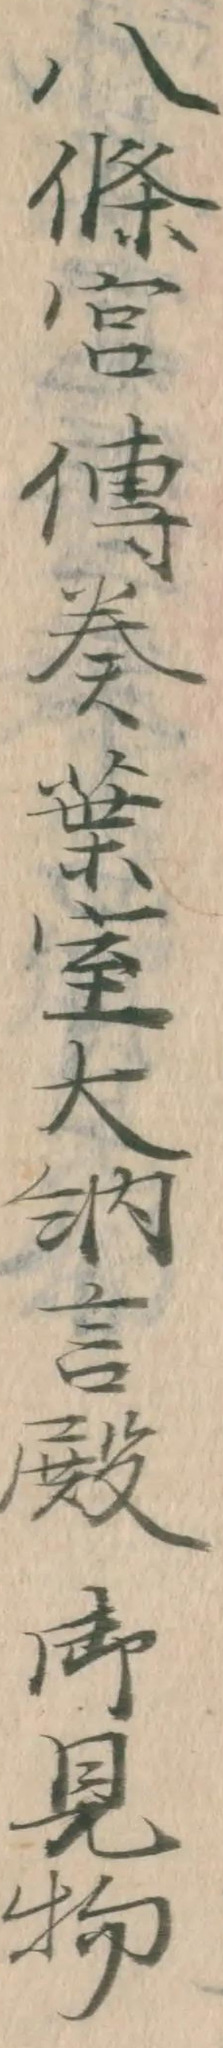八条宮伝奏葉室大納言殿御見物
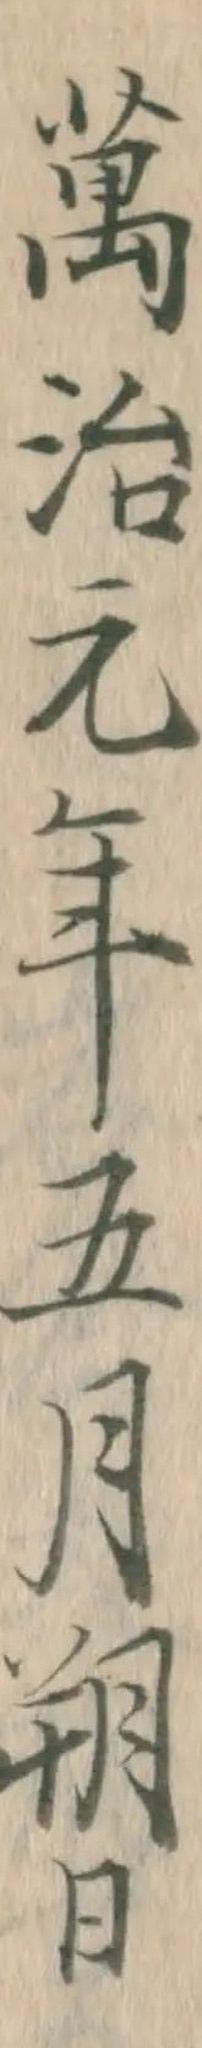萬治元年五月朔日
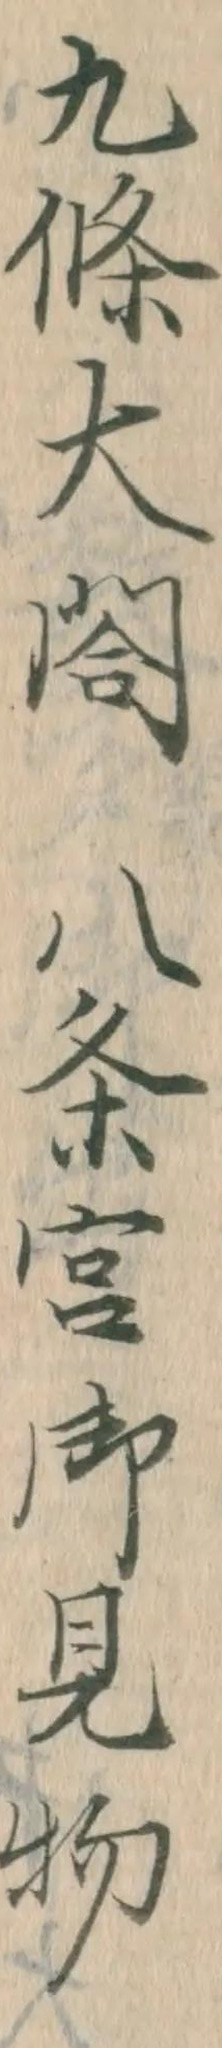九条大閤八条宮御見物
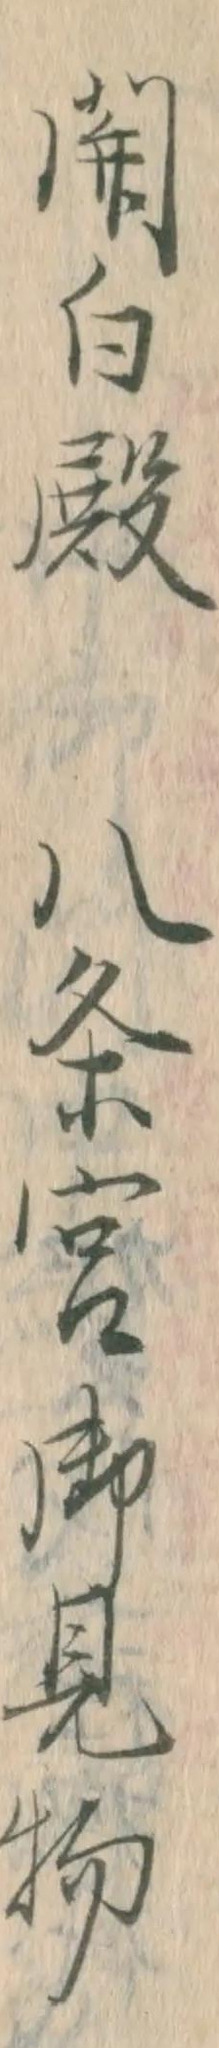関白殿八条宮御見物
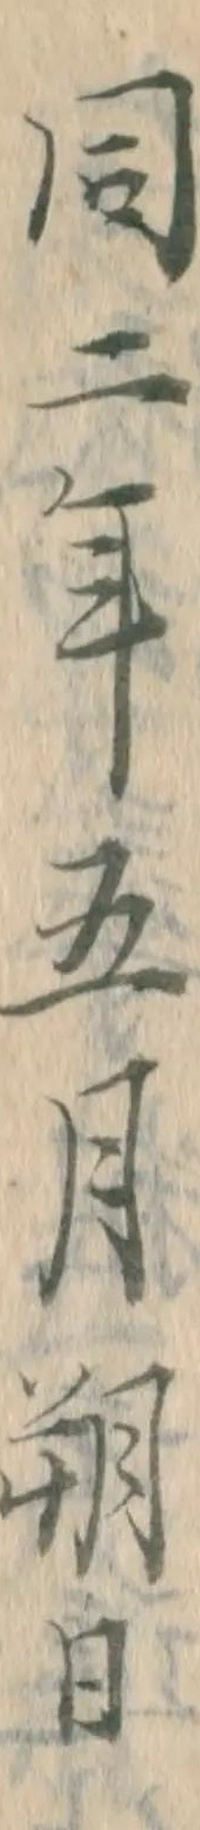同二年五月朔日
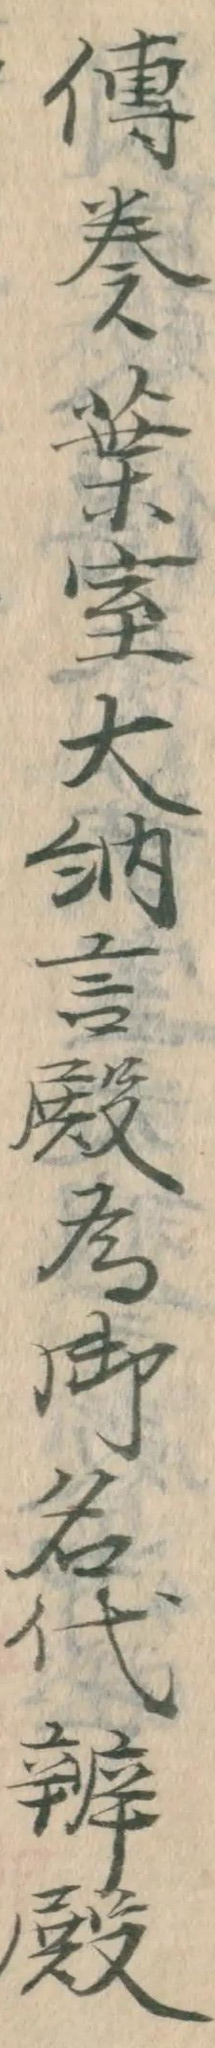伝奏葉室大納言殿為御名代弁殿
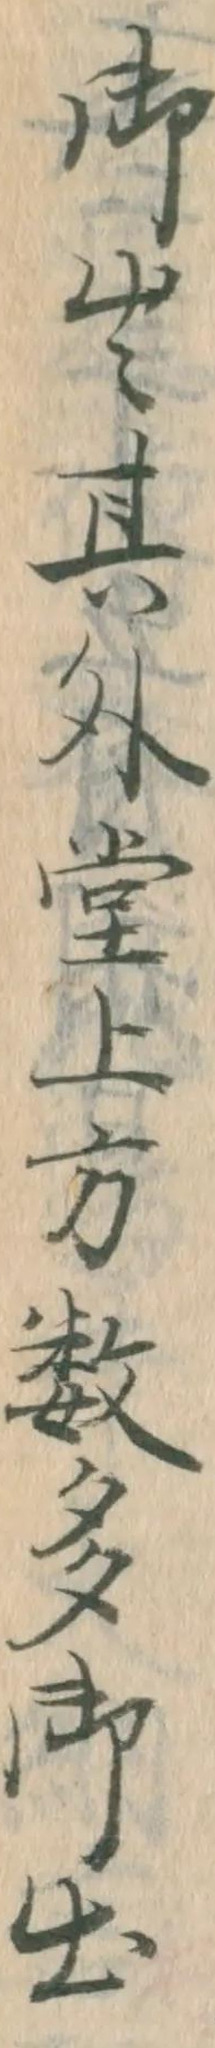御出其外堂上方数多御出

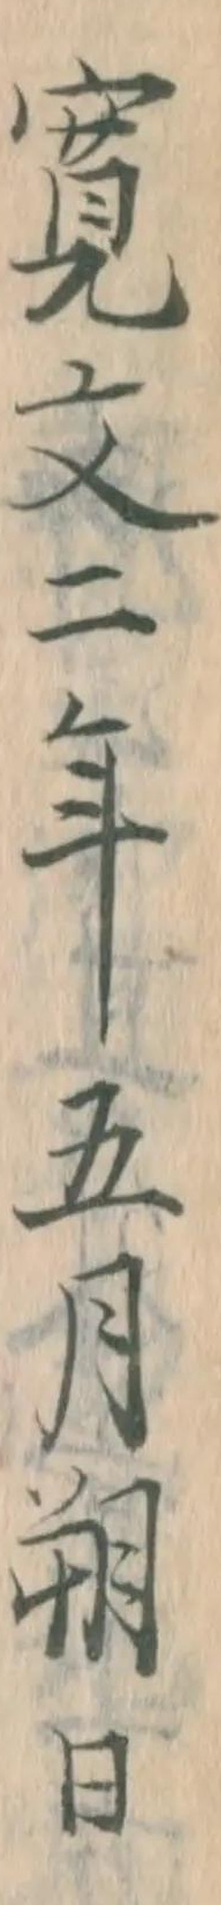寛文二年五月朔日
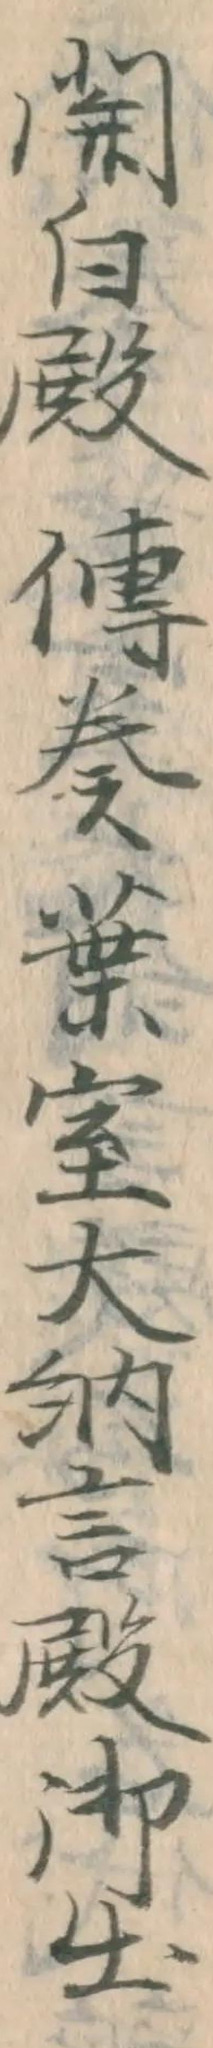関白殿伝奏葉室大納言殿御出
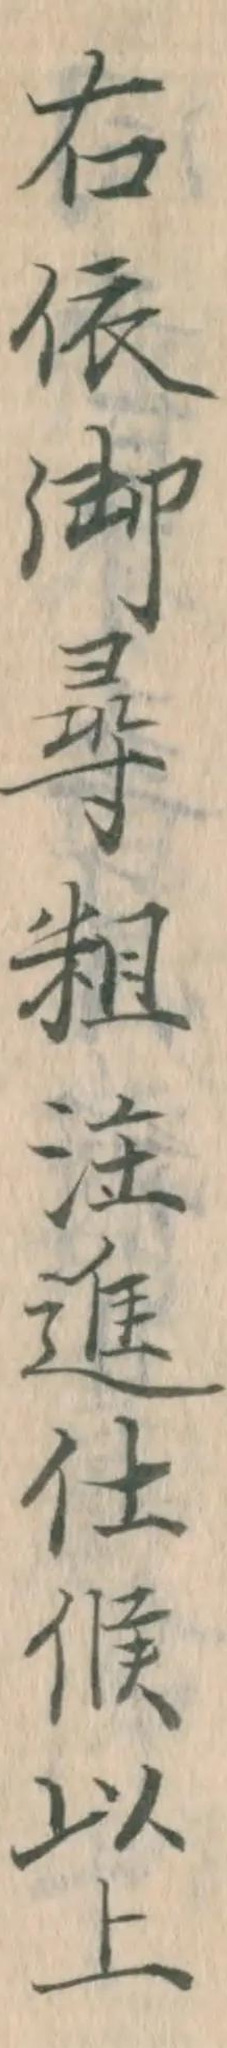右依御尋粗注進仕候以上
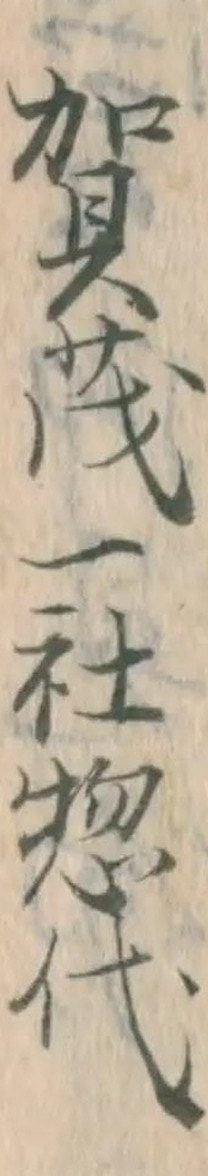賀茂一社惣代
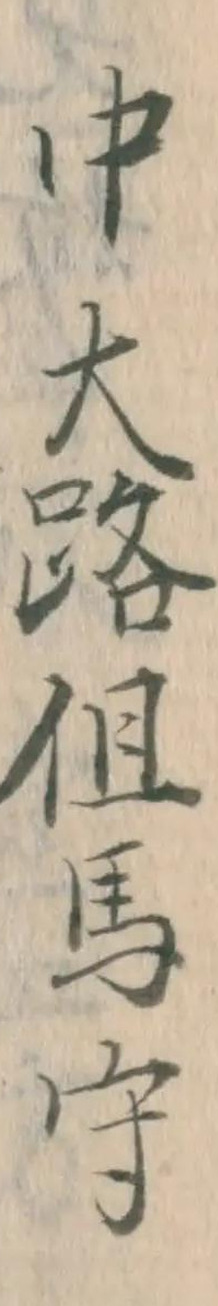中大路但馬守
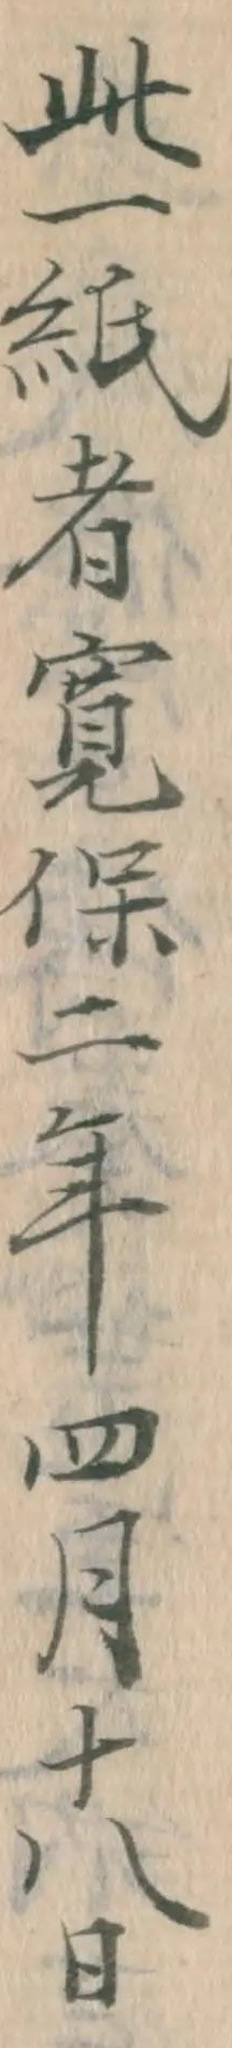此一紙者寛保二年四月十八日
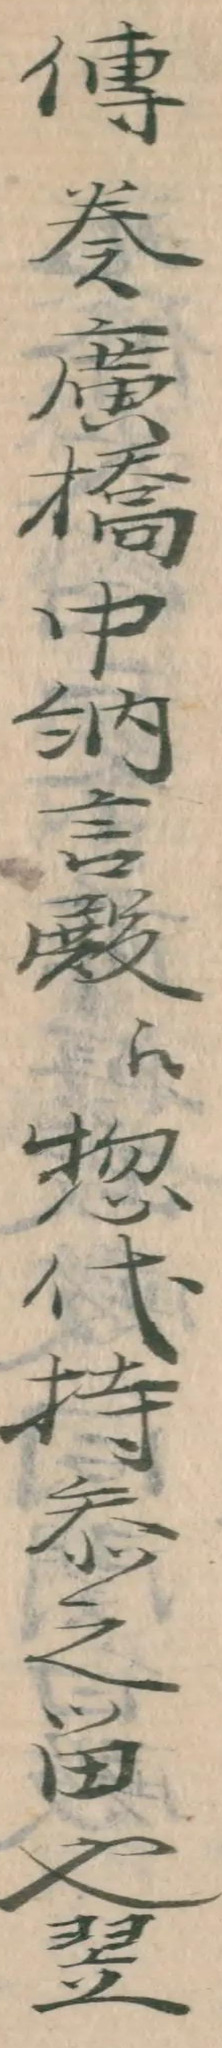伝奏広橋中納言殿江惣代持参之留也翌
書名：賀茂社記録. 第10冊
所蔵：国立国会図書館 National Diet Library, JAPAN
